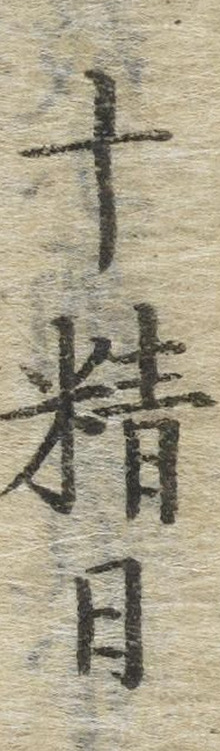十精日
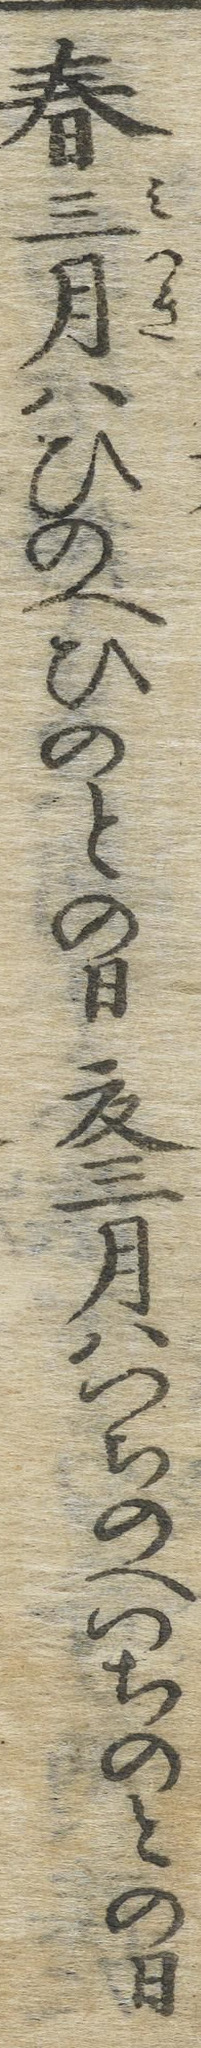春三月はひのへひのとの日夏三月はつちのへつちのとの日
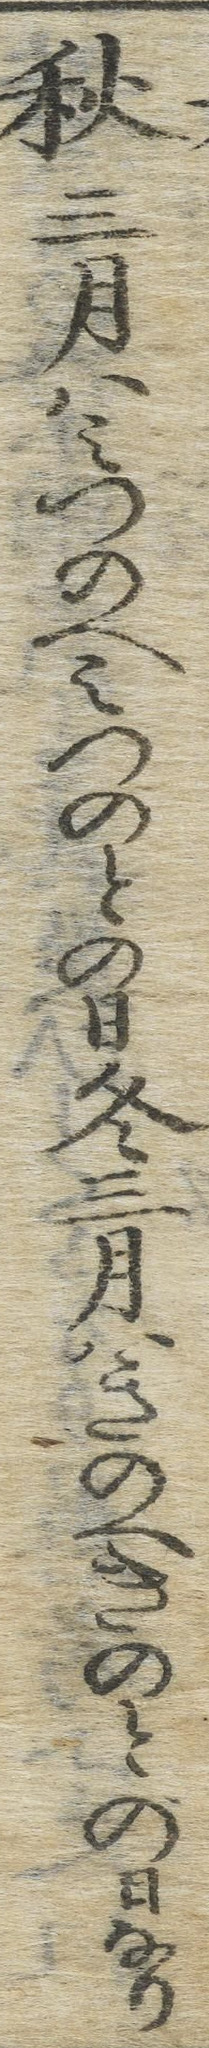秋三月はみつのへみつのとの日冬三月はきのへきのとの日なり
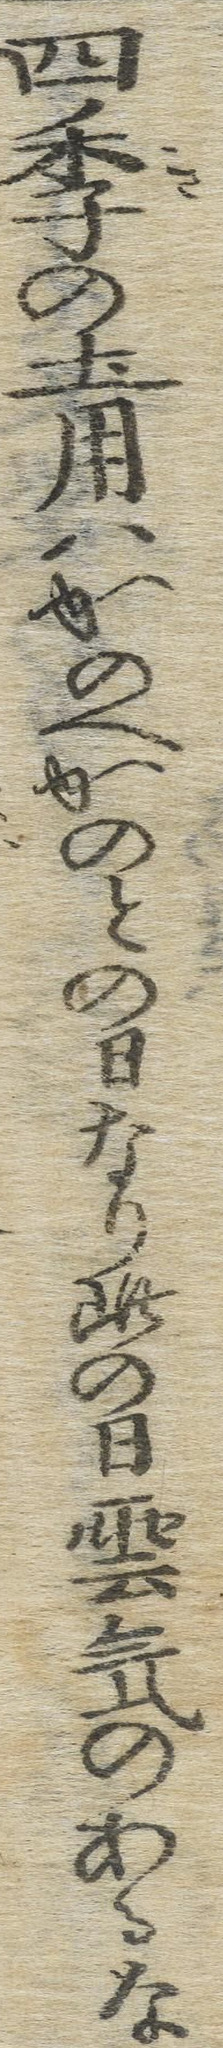四季の土用はかのへかのとの日なり此の日雲気のあるな
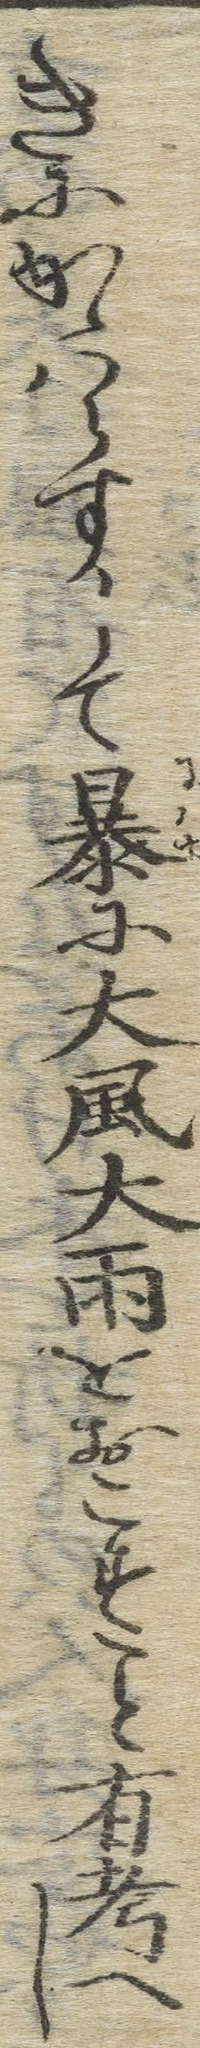きにかゝはらすして暴に大風大雨をおこすこと有考へ
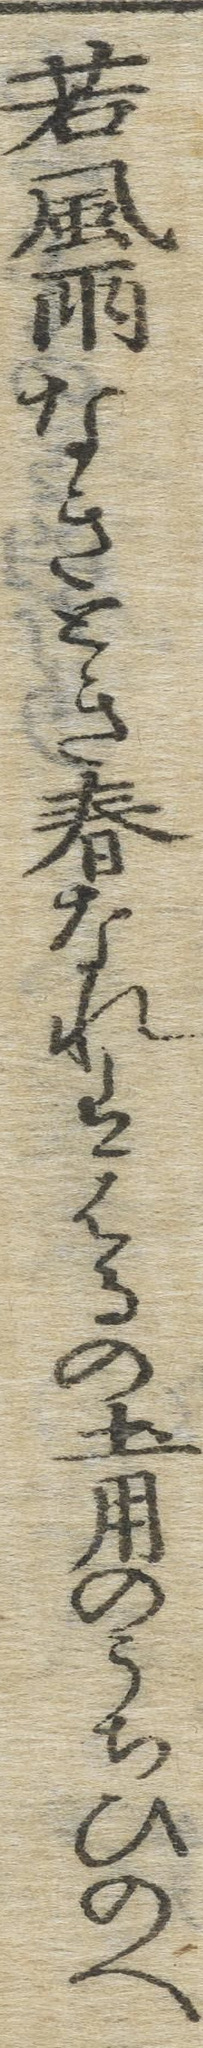若風雨なきとき春なれははるの土用のうちひのへ
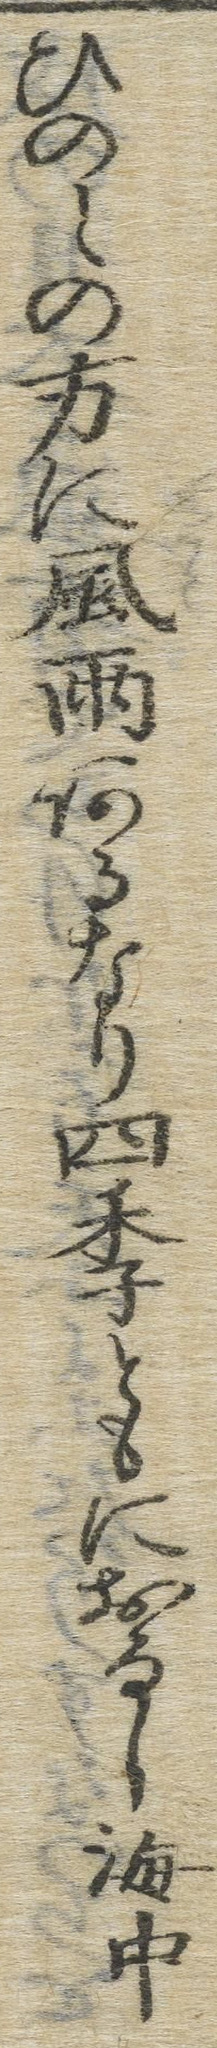ひのとの方に風雨あるなり四季ともにおなし海中
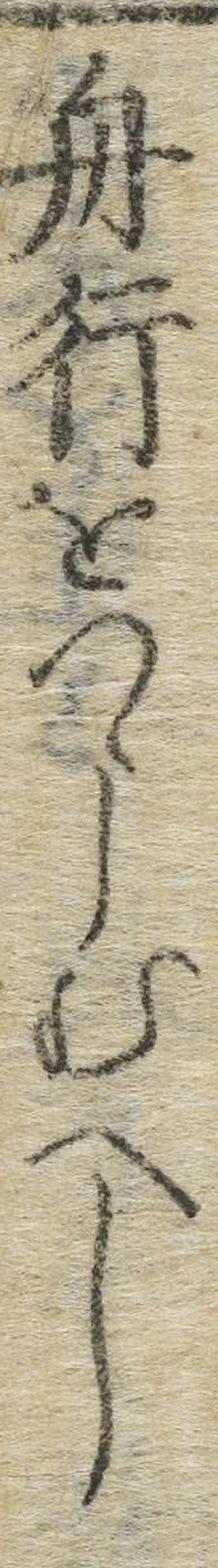舟行をつゝしむへし
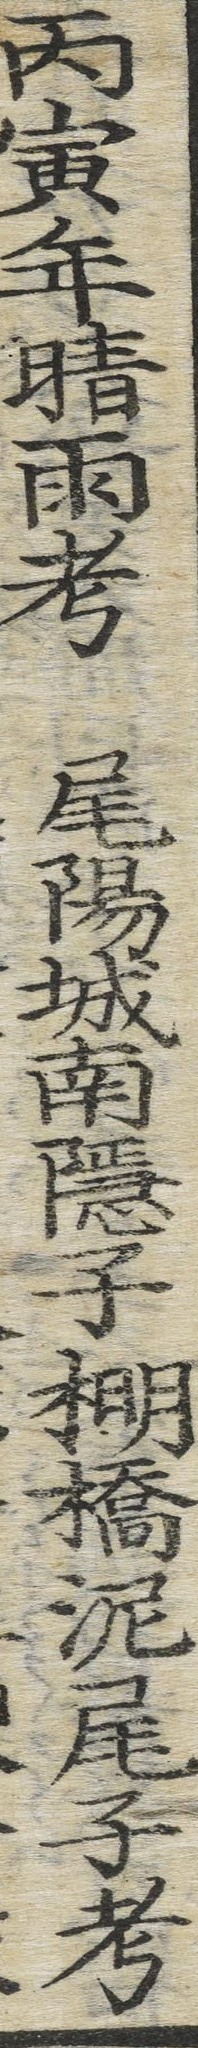丙寅年晴雨考尾陽城南隠子棚橋泥尾子考
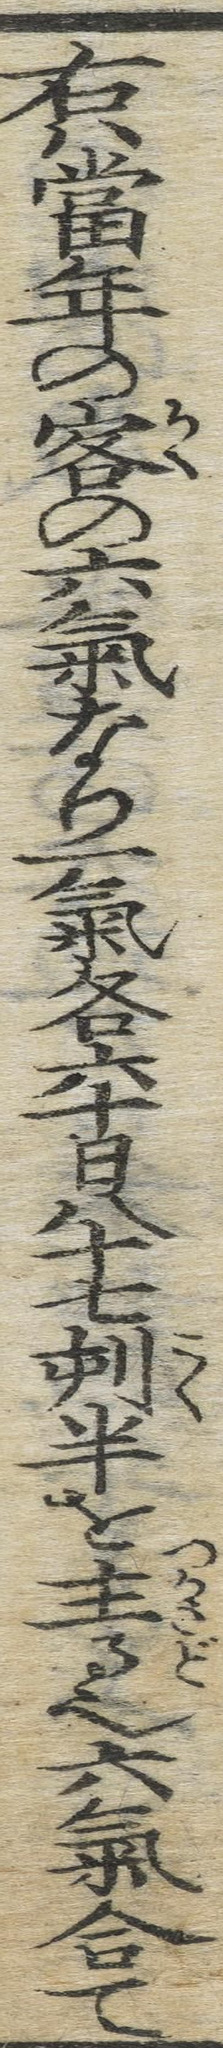右は當年の客の六気なり一気各六十日八十七刻半を主る也六気合て
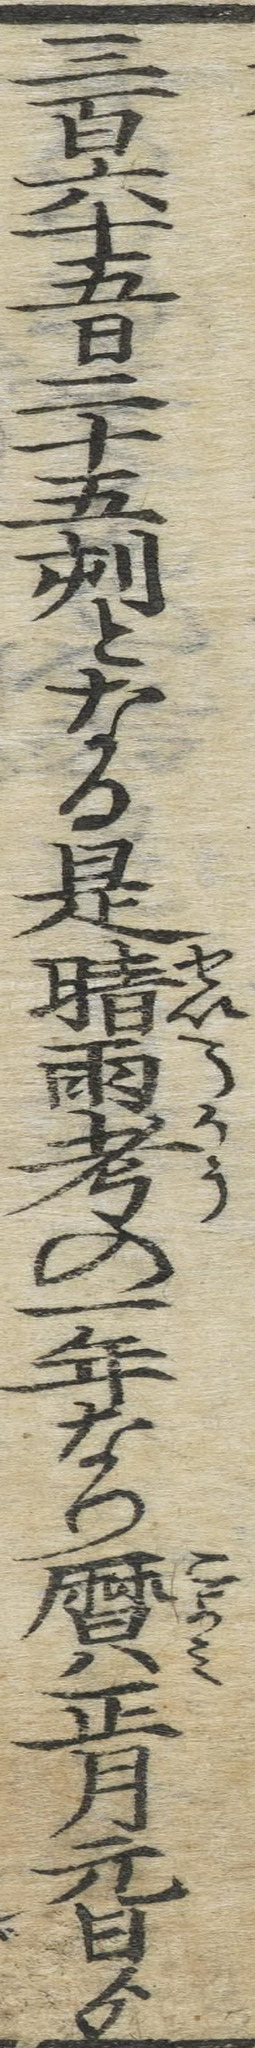三百六十五日二十五刻となる是晴雨考の一年なり暦は正月元日ゟ
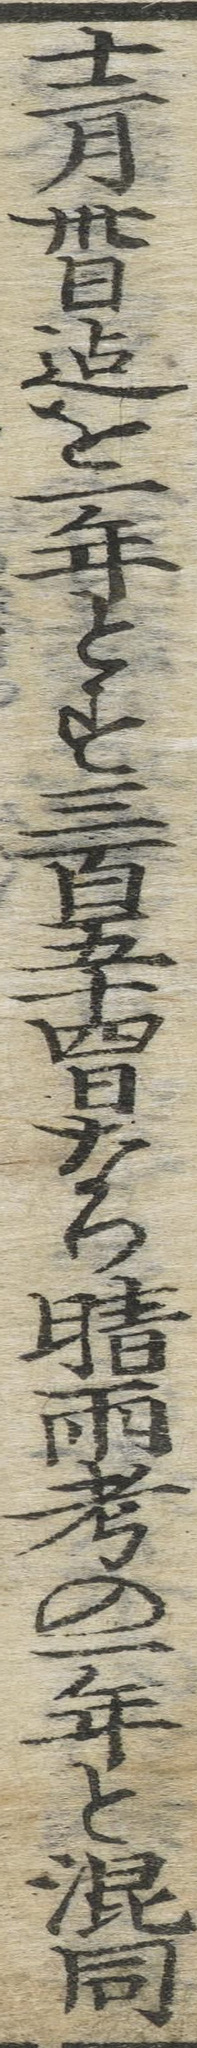十二月三十日迄を一年とす三百五十四日なり晴雨考の一年と混同
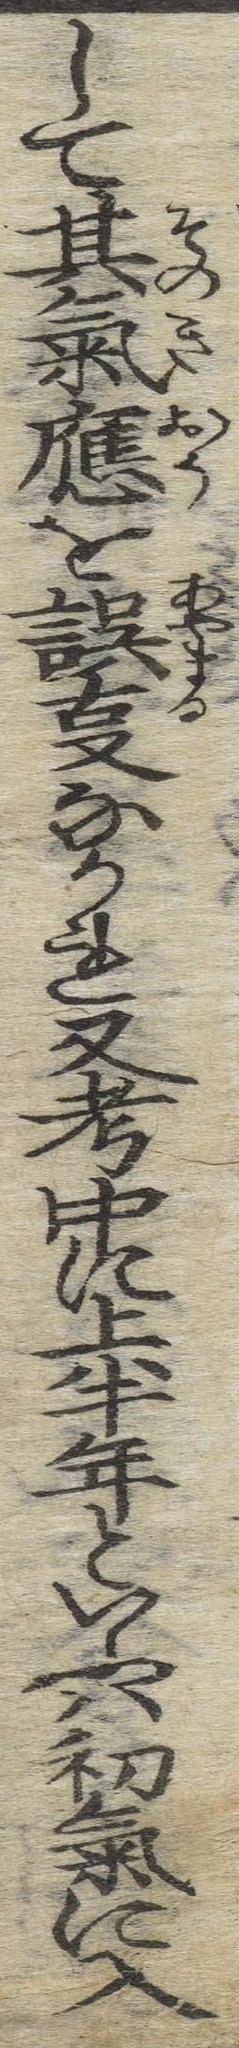して其気應を誤事なかれ又考中に上半年といふは初気に入

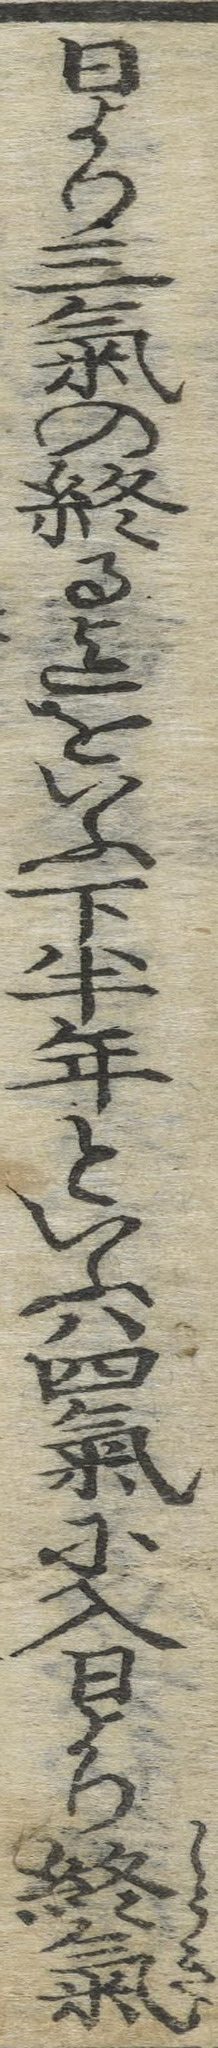日より三気の終る迄をいふ下半年といふは四気に入日より終気
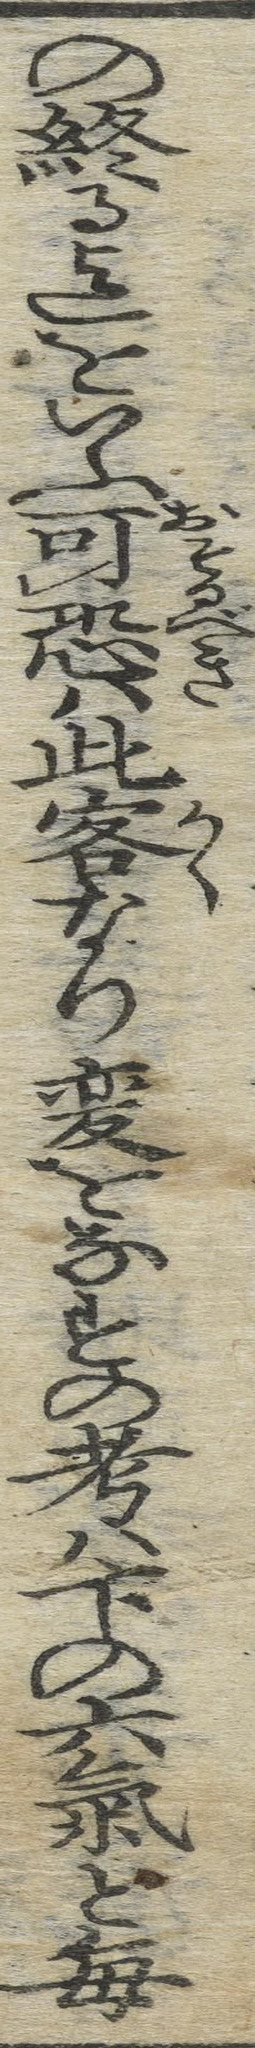の終る迄をいふ可恐は此客なり変をるすの考は下の六気と毎
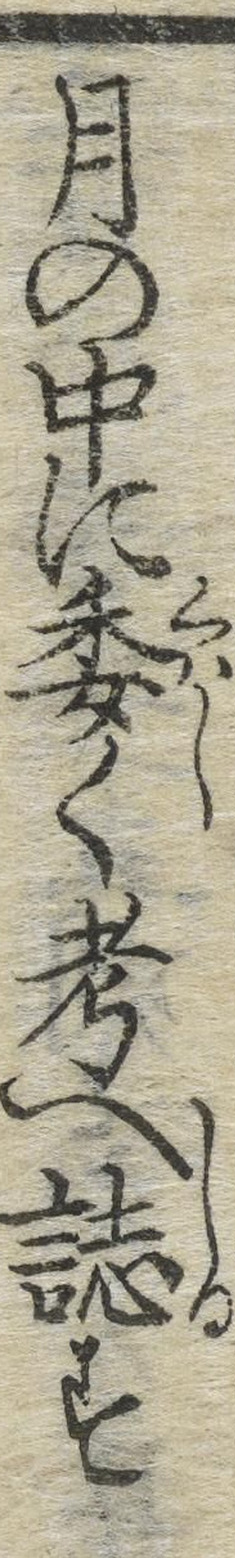月の中に委く考へ誌す
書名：[晴雨考]
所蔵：東京大学地震研究所図書室 Earthquake Research Institute Library, The University of Tokyo, JAPAN
